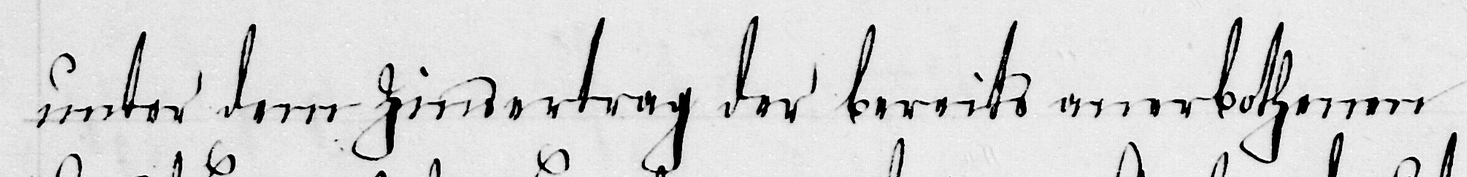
unter dem Zinsertrag der bereits anerbothenen
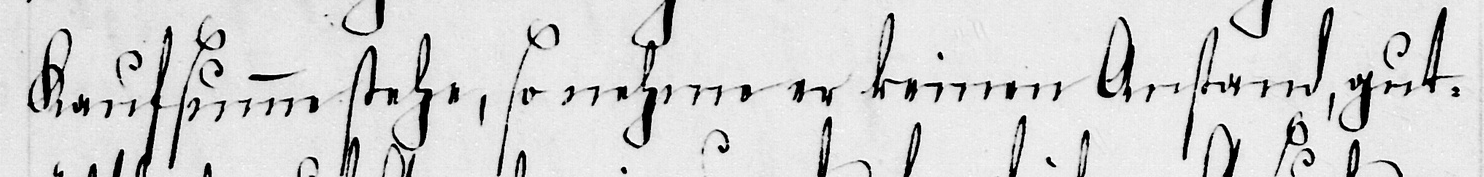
Kaufsumme stehe, so nehme er keinen Anstand, gut¬
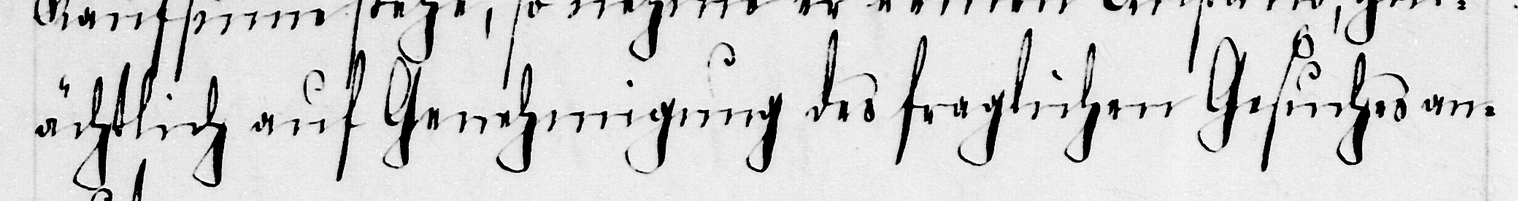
ächtlich auf Genehmigung des fraglichen Gesuches an¬
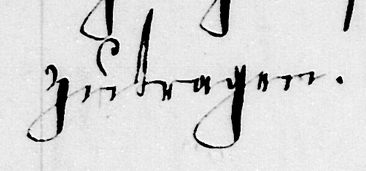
zutragen.
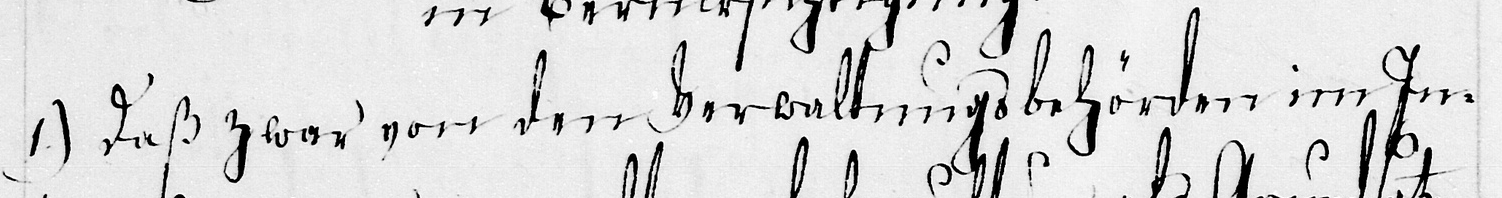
1.) Daß zwar von den Verwaltungsbehörden im In¬
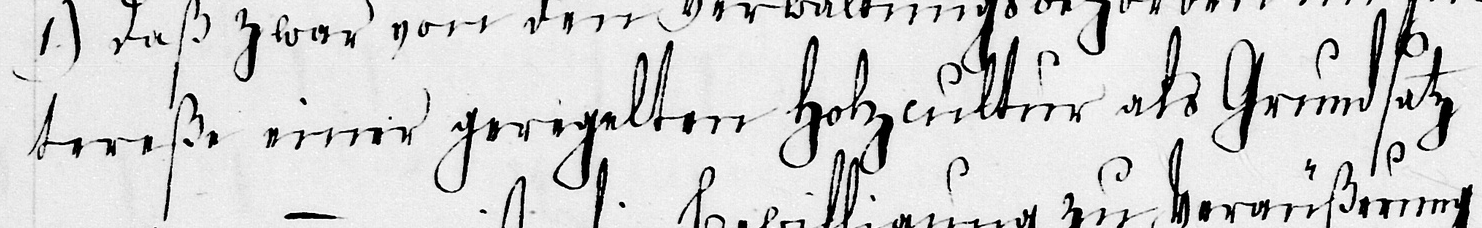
tereße einer geregelten Holzcultur als Grundsatz
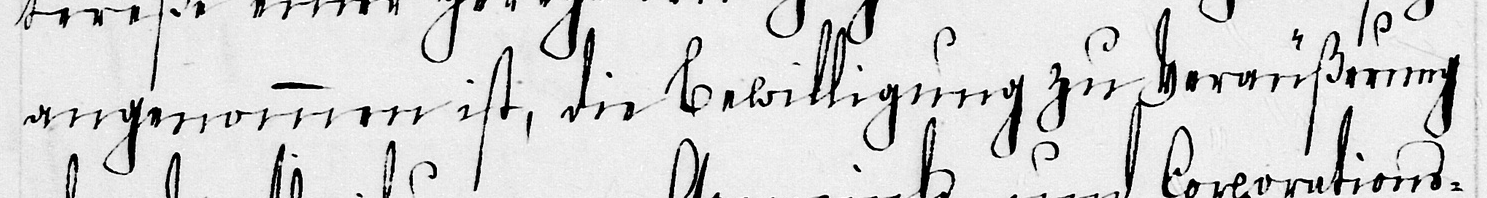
angenommen ist, die Bewilligung zu Veräußerung
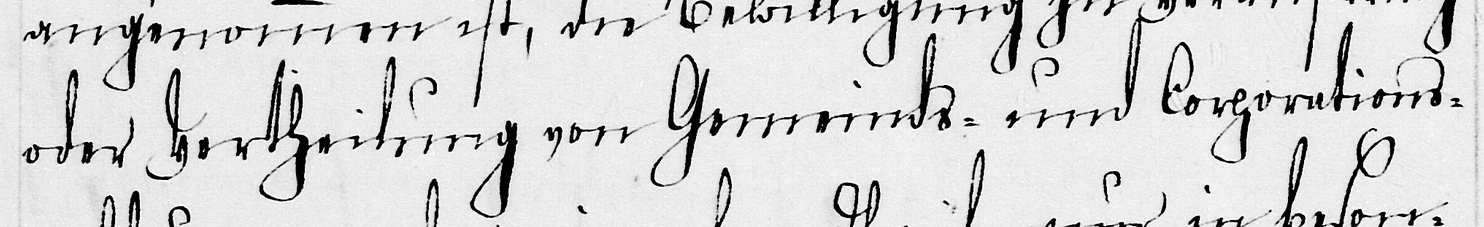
oder Vertheilung von Gemeinds- und Corporations¬
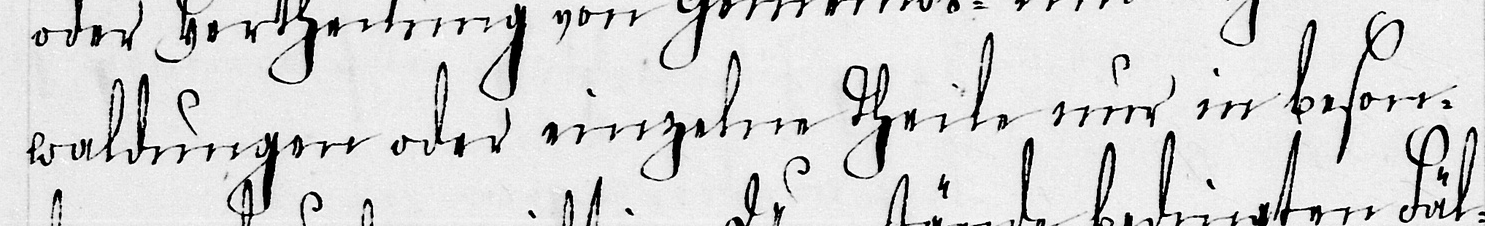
waldungen oder einzelne Theile nur in beson¬
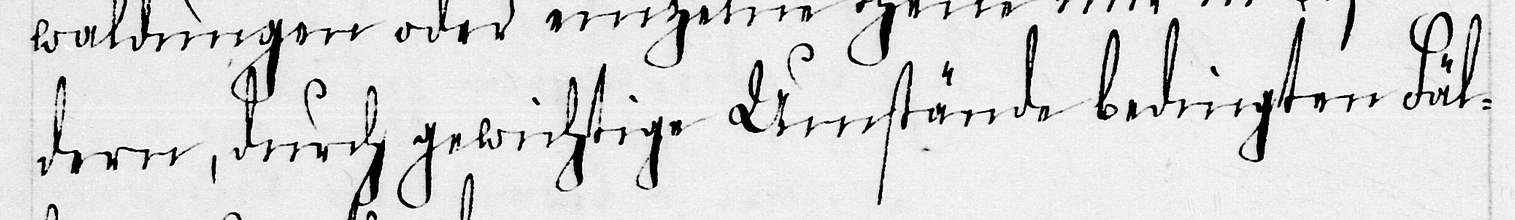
dern, durch gewichtige Umstände bedingten Fäl¬
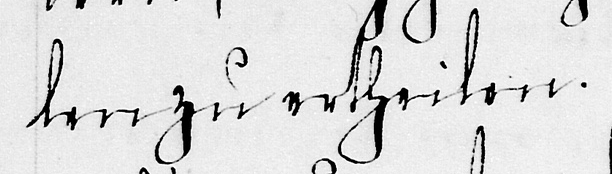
len zu ertheilen.
